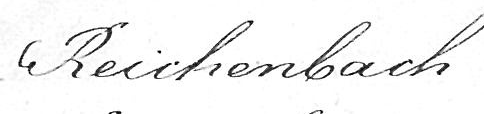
Reichenbach
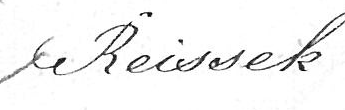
Reissek
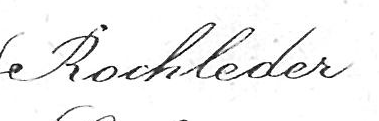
Rochleder
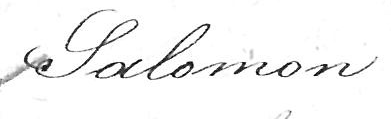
Salomon
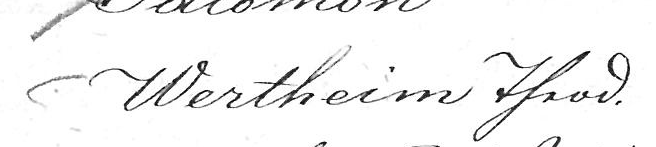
Wertheim Theod.
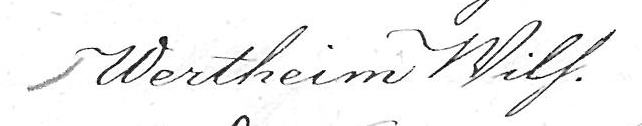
Wertheim Wilh.
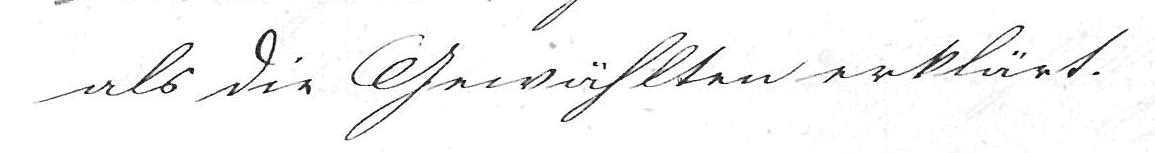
als die Gewählten erklärt.
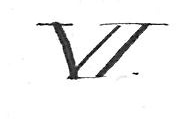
VI.
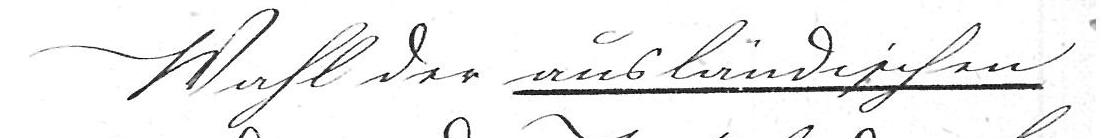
Wahl der ausländischen
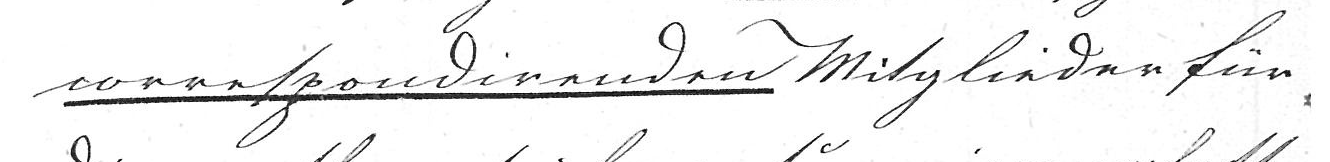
correspondirenden Mitglieder für
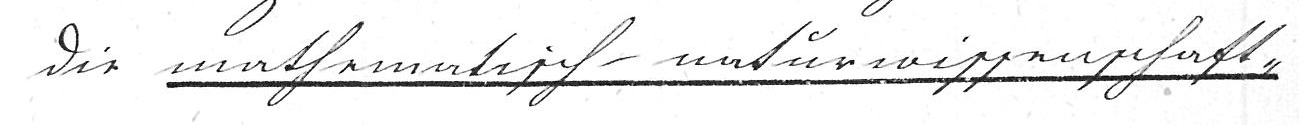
die mathematisch-naturwissenschaft-
